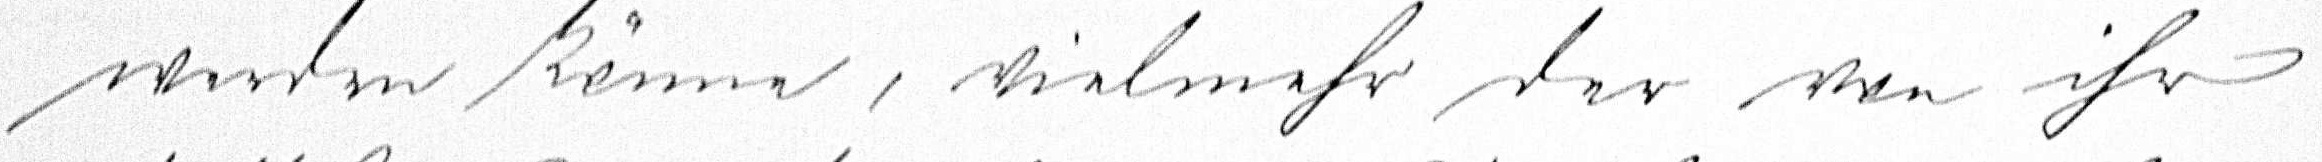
werden könne, vielmehr der von ihr
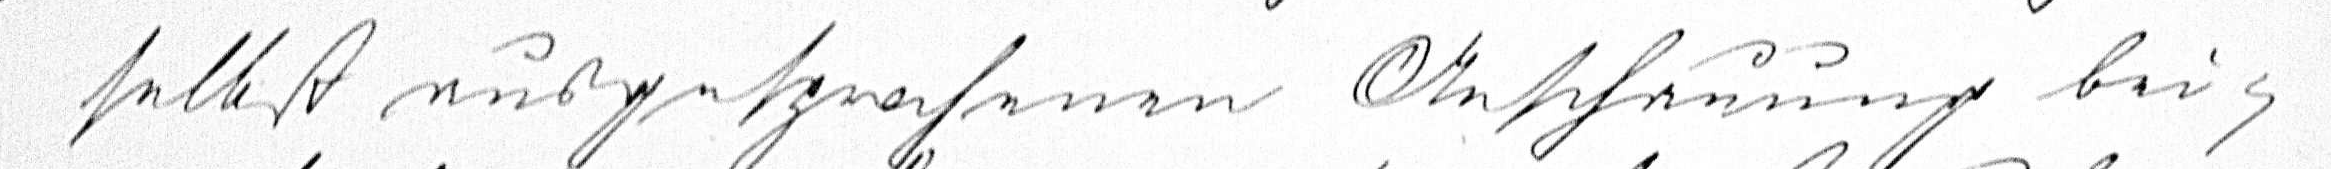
selbst ausgesprochenen Ausschauung bei¬
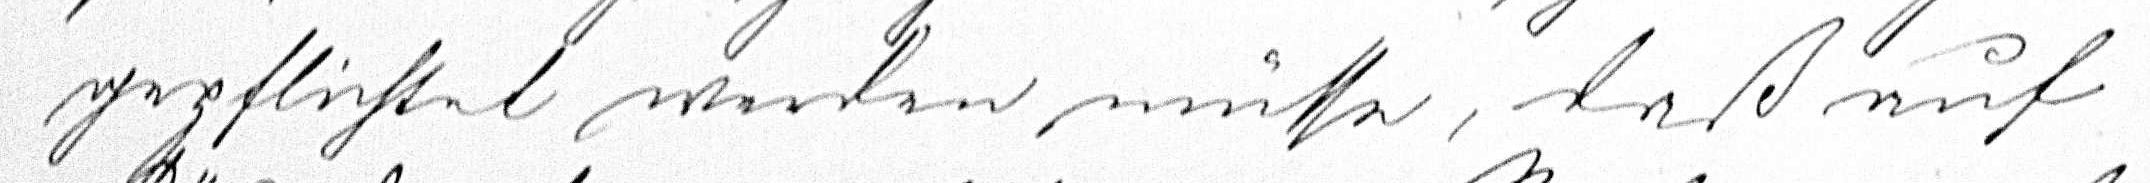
gepflichtet werden müsse, daß auf
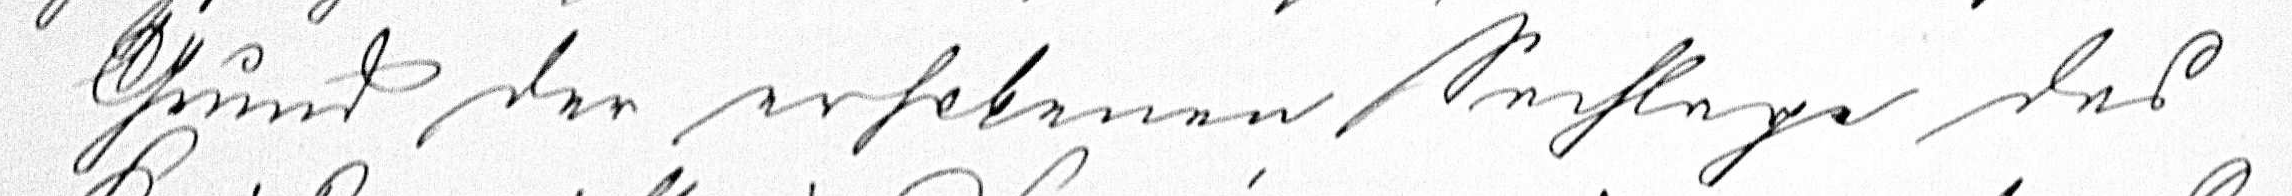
Grund der erhobenen Sachlage des
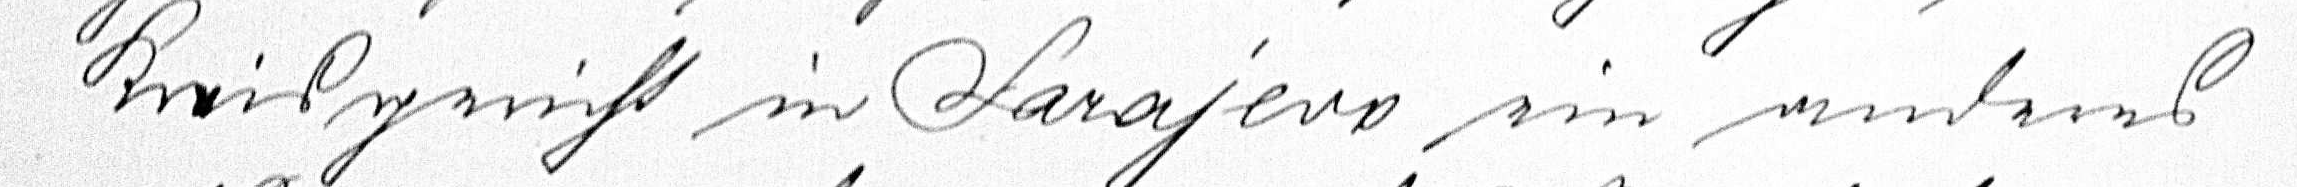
Kreisgericht in Sarajevo ein anderes
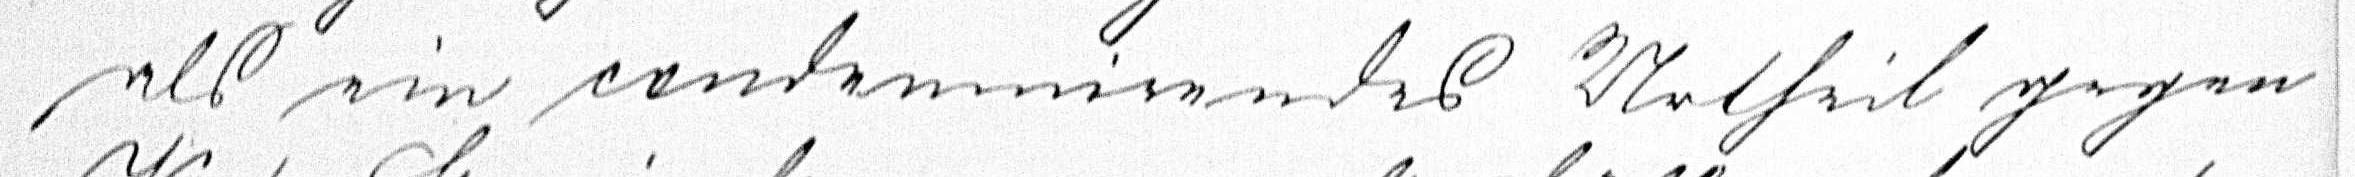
als ein condemnirendes Urtheil gegen
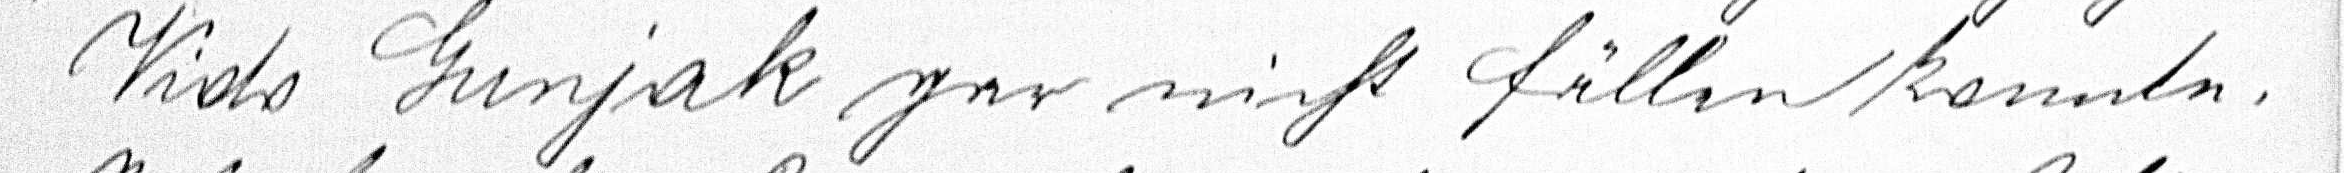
Vide Gunjak gar nicht fällen konnte.
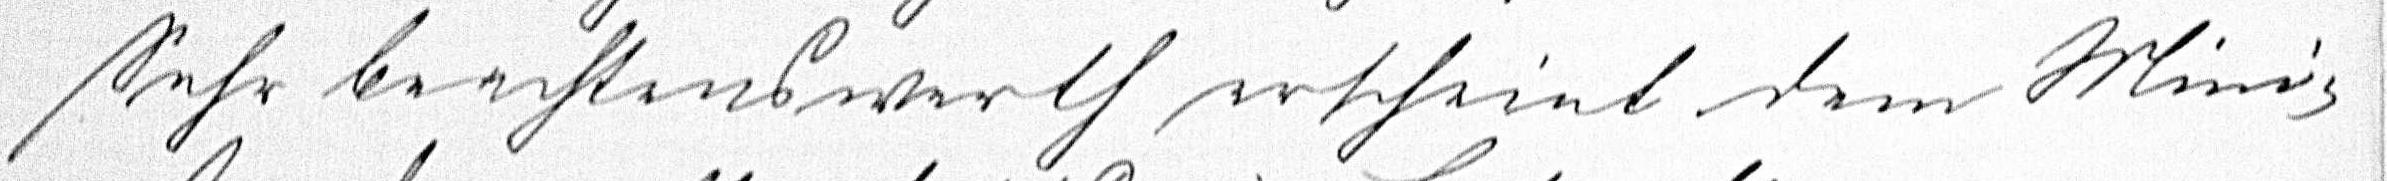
Sehr beachtenswerth erscheint dem Mini¬
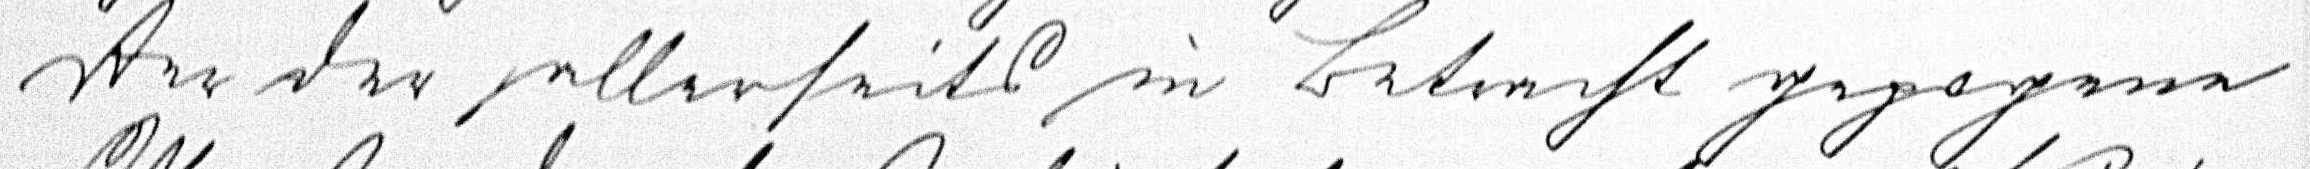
ster der allerseits in Betracht gezogene
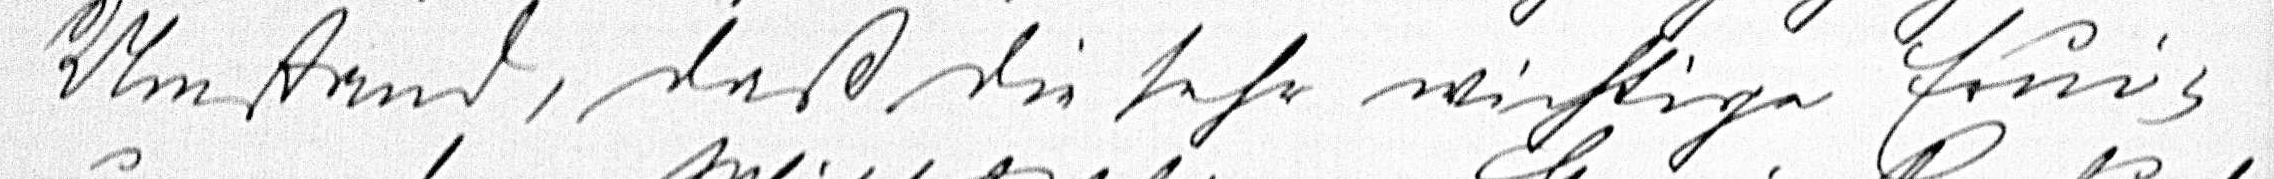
Umstand, daß die sehr wichtige Erui¬
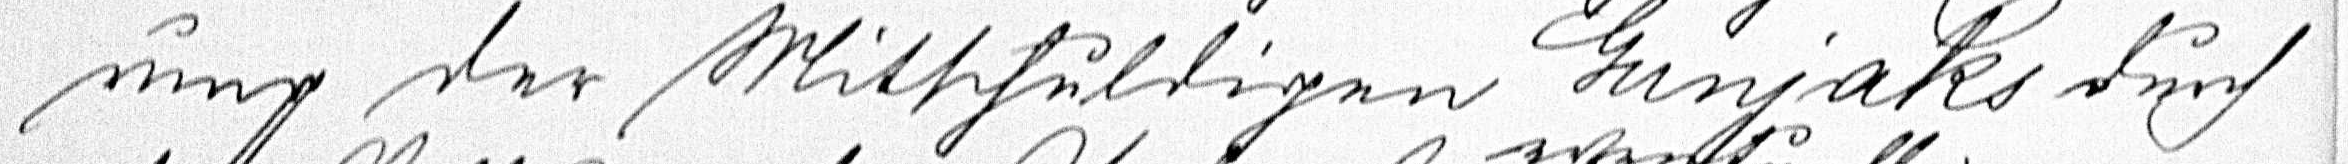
rung der Mithschuldigen Gunjaks durch
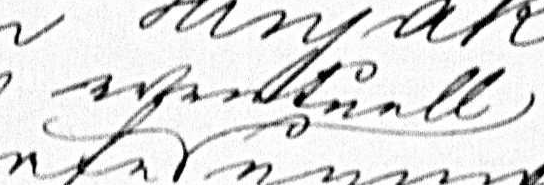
eventuell
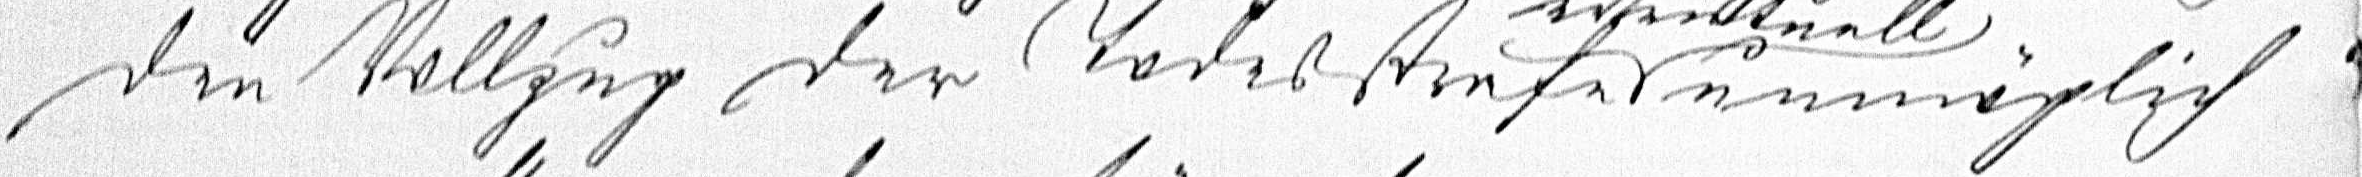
den Vollzug der Todesstrafe unmöglich
